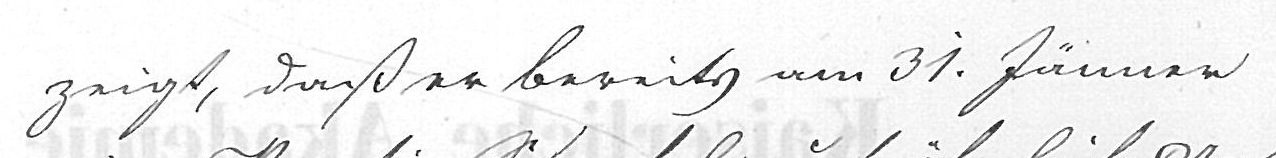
zeigt, daß er bereits am 31. Jänner
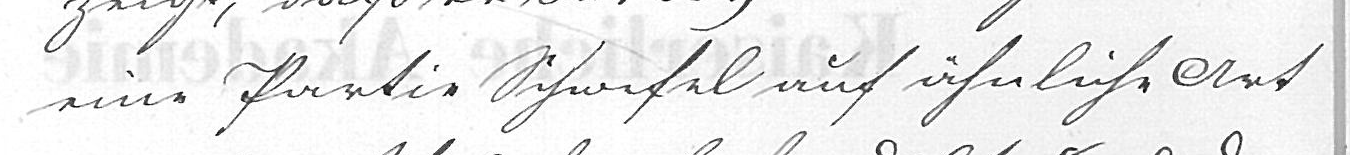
eine Partie Schwefel auf ähnliche Art
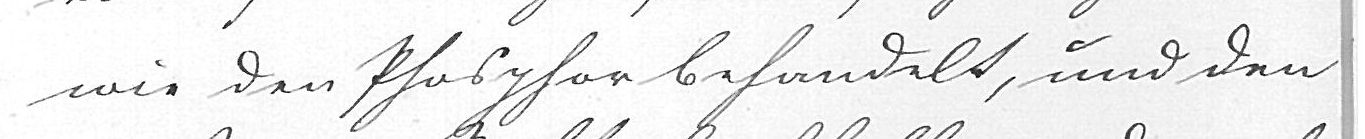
wie den Phosphor behandelt, und den
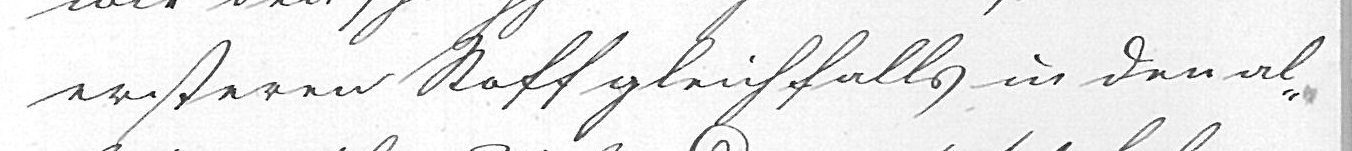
ersteren Stoff gleichfalls in den al-
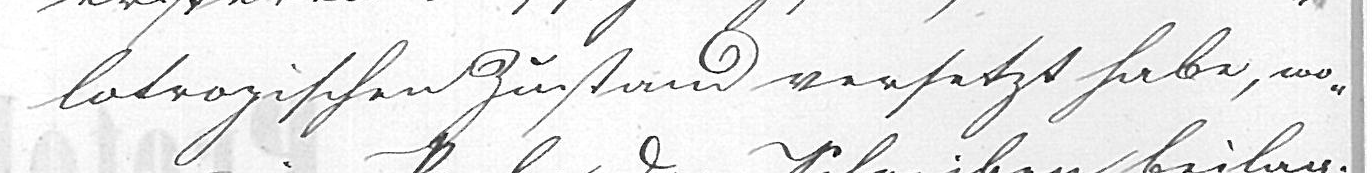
lotrogischen Zustand versetzt habe, wo-
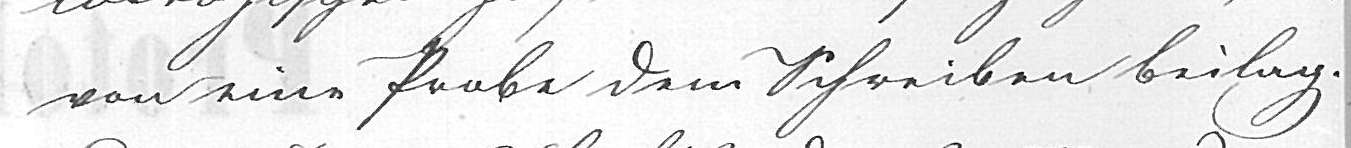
von eine Probe dem Schreiben beilag.
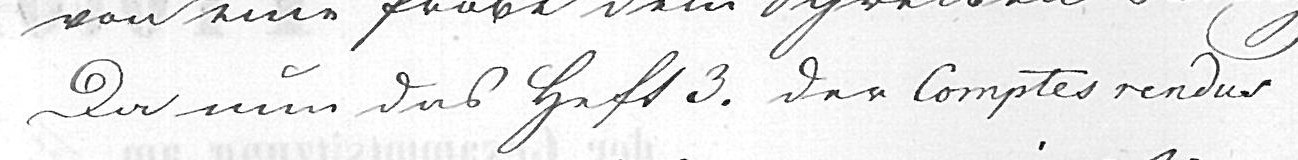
Da nun das Heft 3. der Comptes rendus
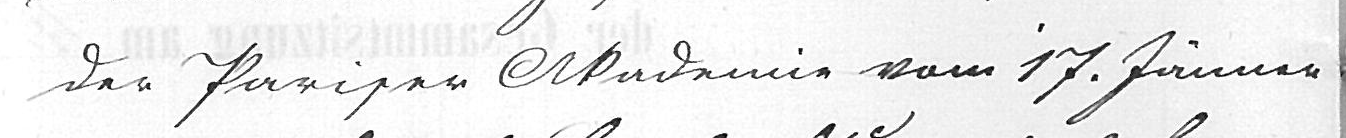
der Pariser Akademie vom 17. Jänner
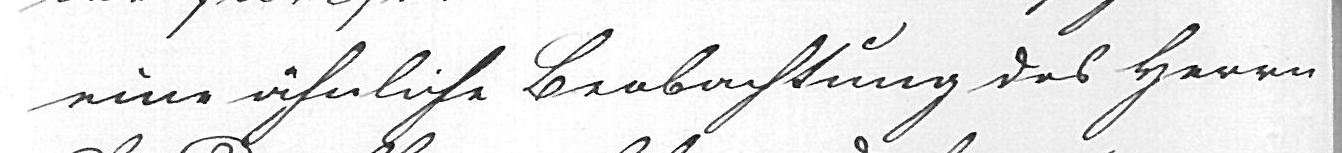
eine ähnliche Beobachtung des Herrn
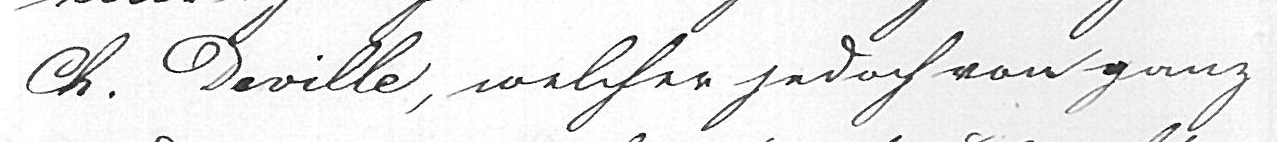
Ch. Deville, welcher jedoch von ganz
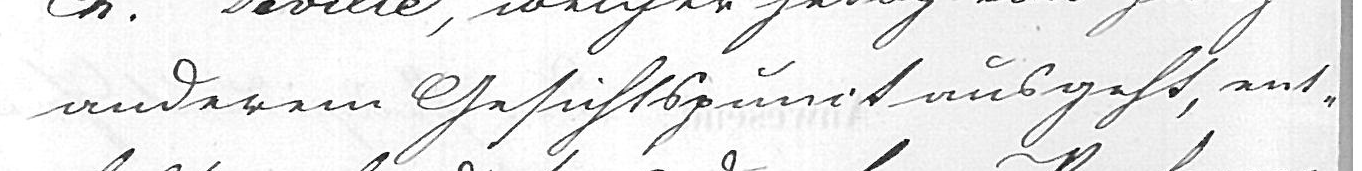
anderem Gesichtspunct ausgeht, ent-
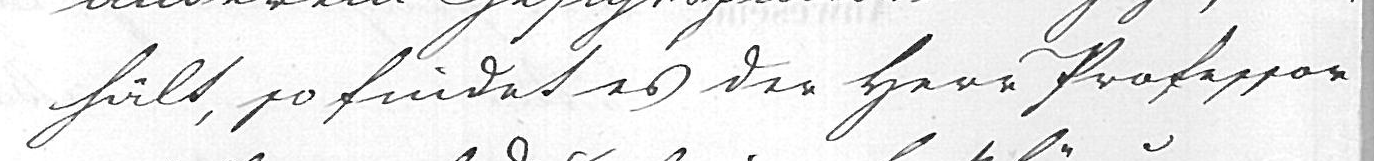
hält, so findet es der Herr Professor
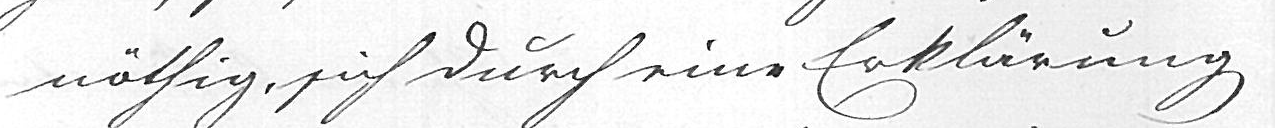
nöthig, sich durch eine Erklärung
